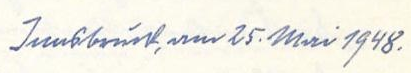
Lieber Freund!
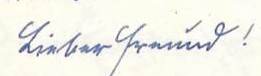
Innsbruck, am 25 Mai 1948.
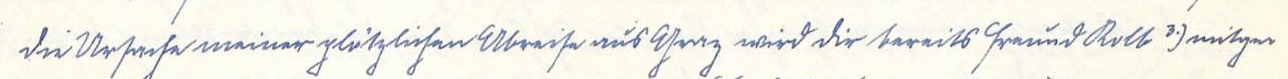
Die Ursache meiner plötzlichen Abreise aus Graz wird dir bereits Freund Kolb 3) mitge-
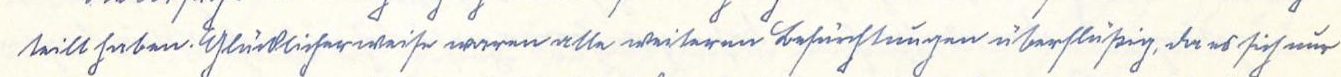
teilt haben. Glücklicherweise waren alle weiteren Befürchtungen überflüssig, da es sich nur
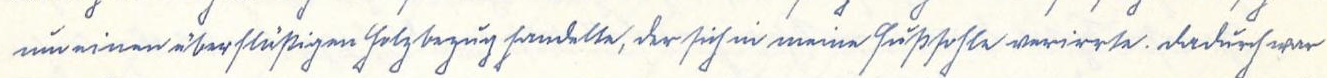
um einen überflüßigen Holzbezug handelte, der sich in meine Fußsohle verirrte. Dadurch war
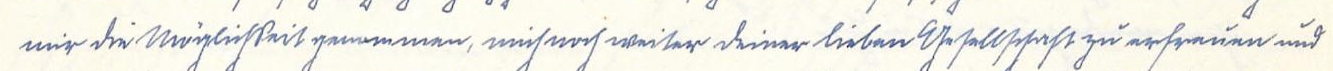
mir die Möglichkeit genommen, mich noch weiter deiner lieben Gesellschaft zu erfreuen und
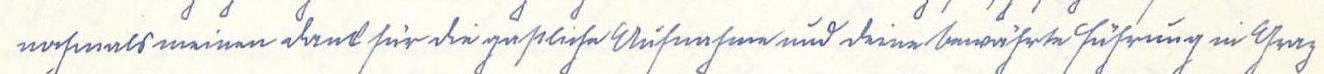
nochmals meinen Dank für die gastliche Aufnahme und deine gewährte Führung in Graz
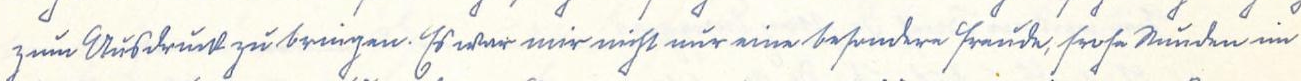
zum Ausdruck zu bringen. Es wäre nicht nur eine besondere Freude, frohe Stunden im
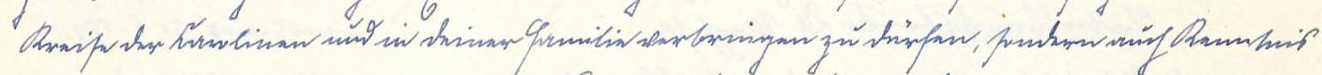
Kreise der Carolinen und den seiner Familie verbringen zu dürfen, sondern auch Kenntnis
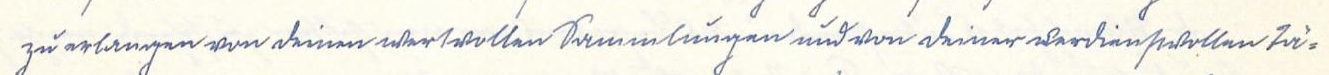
zu erlangen von deinen wertvollen Sammlungen von deiner verdienstvollen Tä-
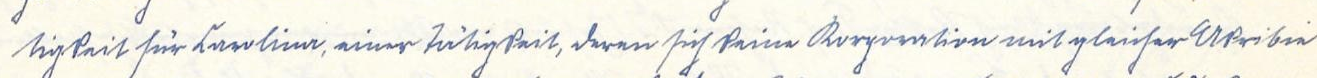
tigkeit für Carolina, einer Tätigkeit, deren sich keine Korporation mit gleicher Akribie
